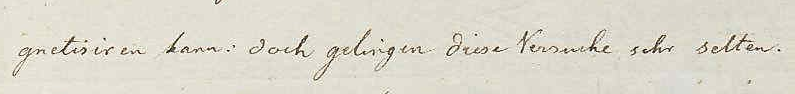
gnetisiren kann: doch gelingen diese Versuche sehr selten.
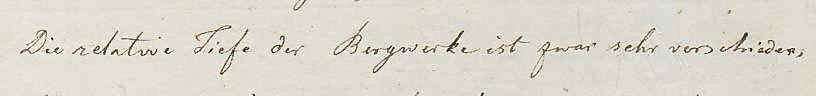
Die relative Tiefe der Bergwerke ist zwar sehr verschieden,
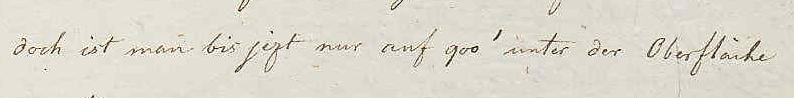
doch ist man bis jezt nur auf 900′ unter der Oberfläche
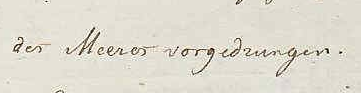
des Meeres vorgedrungen.
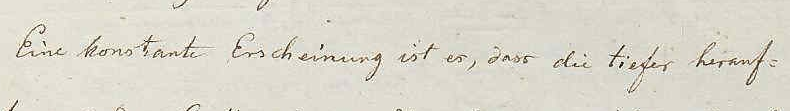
Eine konstante Erscheinung ist es, dass die tiefer herauf-
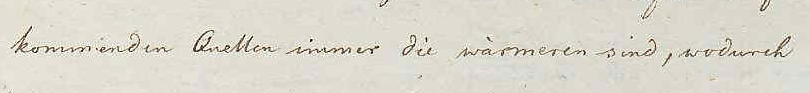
kommenden Quellen immer die wärmeren sind, wodurch
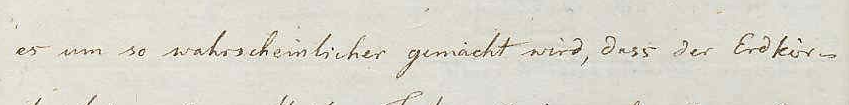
es um so wahrscheinlicher gemacht wird, dass der Erdkör-
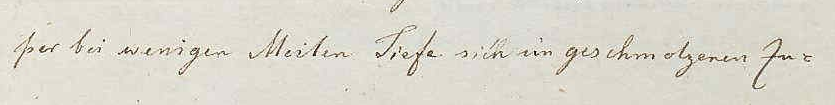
per bei wenigen Meilen Tiefe sich im geschmolzenen Zu-
